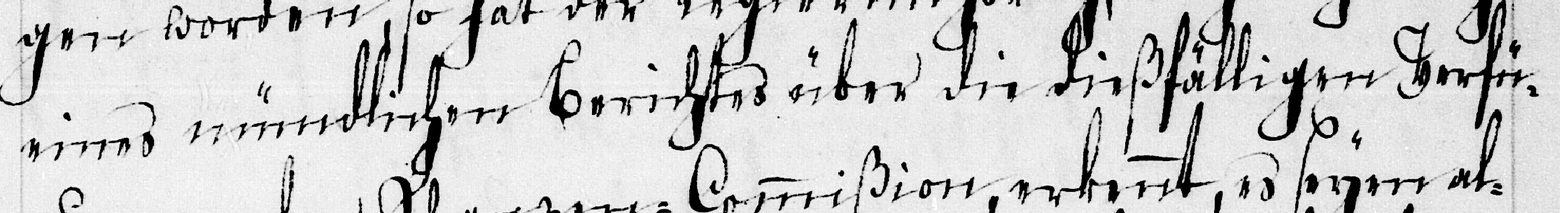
eines mündlichen Berichtes über die dießfälligen Verfü¬
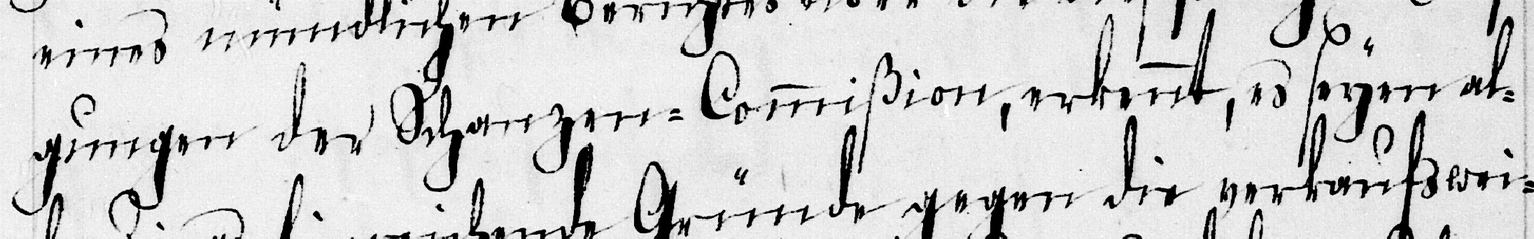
gungen der Schanzen-Commißion, erkannt, es seyen al¬
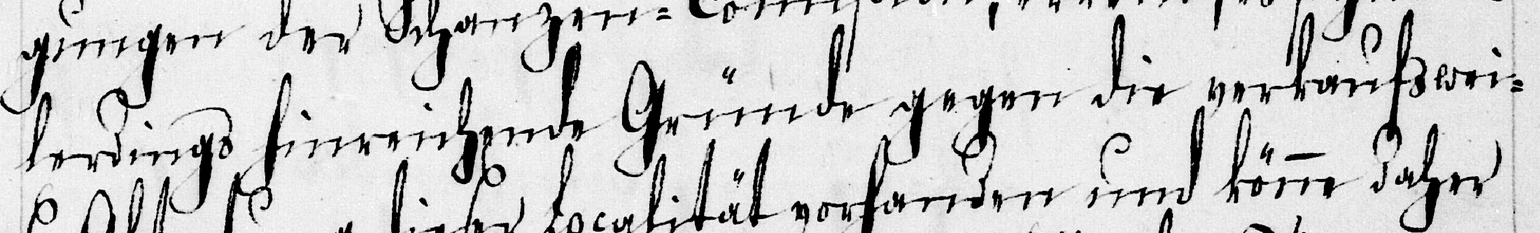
lerdings hinreichende Gründe gegen die verkaufswei¬
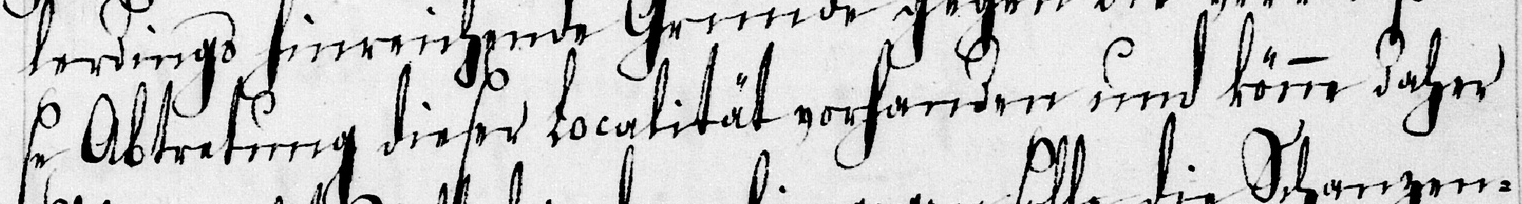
se Abtretung dieser Localität vorhanden und könne daher
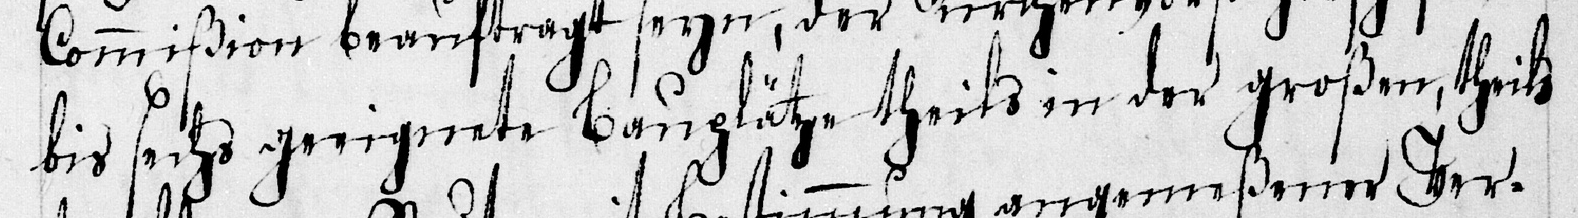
bis sechs geeignete Bauplätze theils in der großen, theils
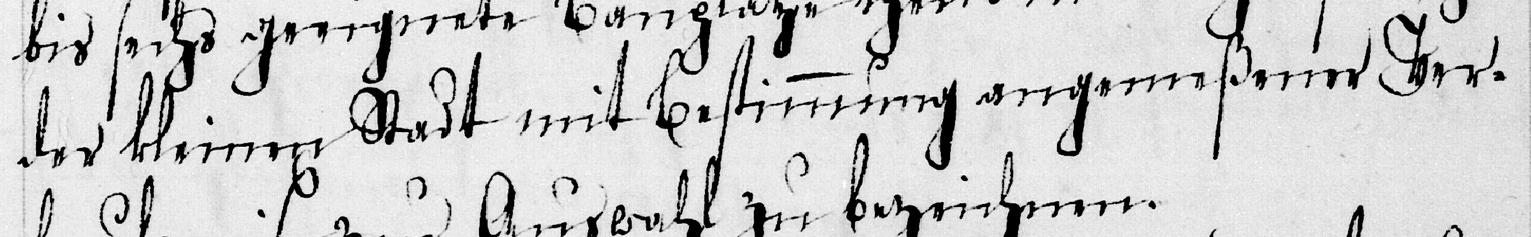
der kleinen Stadt mit Bestimmung angemeßener Ver¬
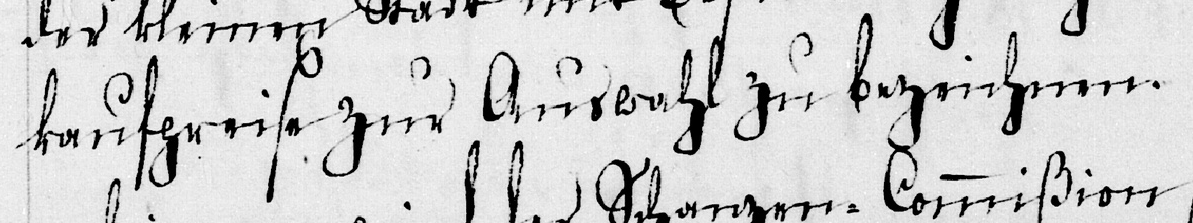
kaufpreise zur Auswahl zu bezeichnen.
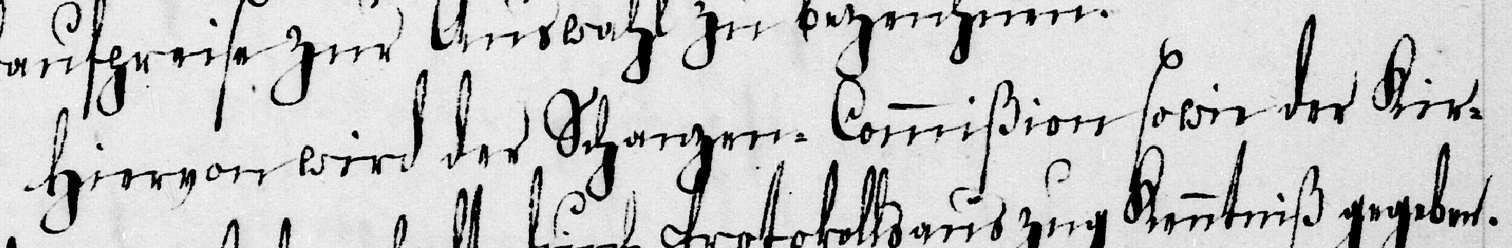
Hiervon wird der Schanzen-Commißion sowie der Kir¬
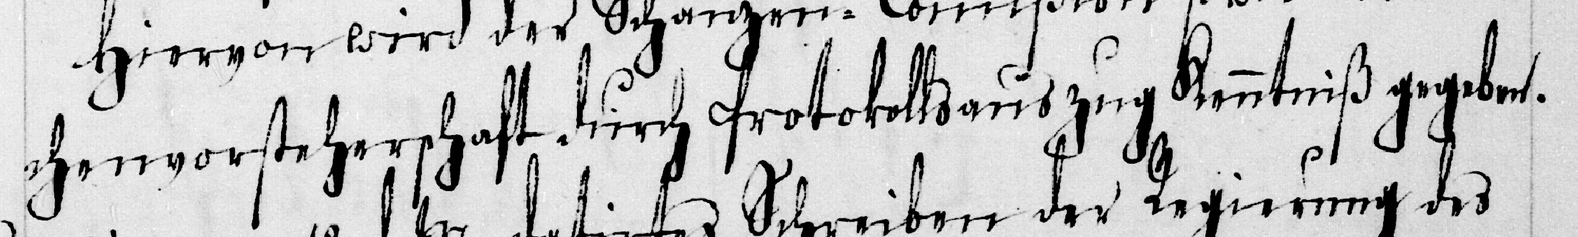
chenvorsteherschaft durch Protokollsauszug Kenntniß gegeben.
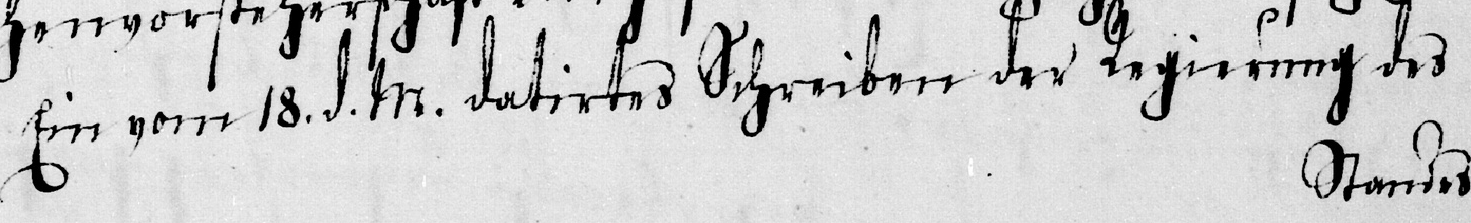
Ein vom 18. d. M. datirtes Schreiben der Regierung des
